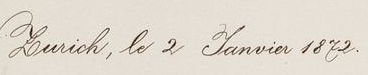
Zurich, le 2 Janvier 1872.
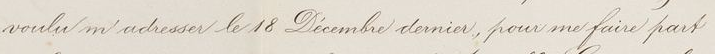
voulu m'adresser le 18 Décembre dernier, pour me faire part
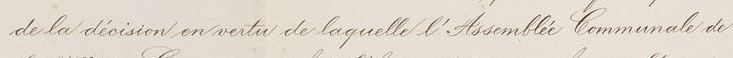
de la décision en vertu de laquelle l'Assemblée Communale de
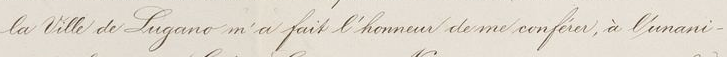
la Ville de Lugano m'a fait l'honneur de me conférer, à l'unani-
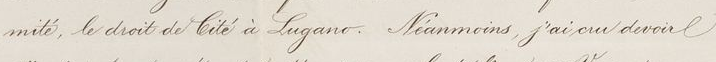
mité, le droit de Cité à Lugano. Néanmoins, j'ai cru devoir
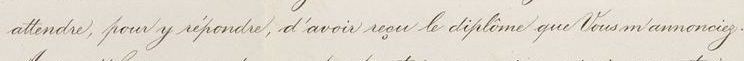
attendre, pour y répondre, d'avoir reçu le diplôme que Vous m'annonciez.
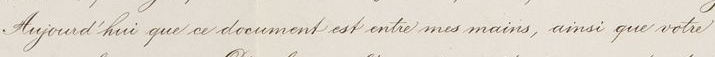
Aujourd'hui que ce document est entre mes mains, ainsi que votre
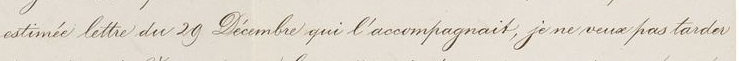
estimée lettre du 29 Décembre qui l'accompagnait, je ne veux pas tarder
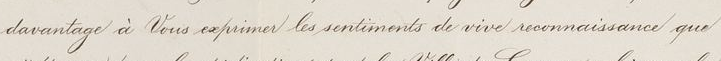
davantage à Vous exprimer les sentiments de vive reconnaissance que
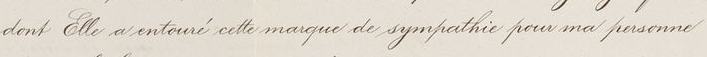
dont Elle a entouré cette marque de sympathie pour ma personne
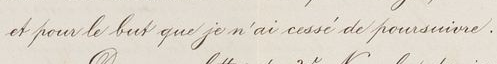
et pour le but que je n'ai cessé de poursuivre.
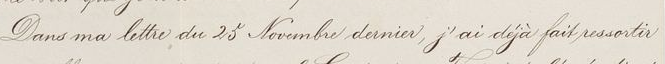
Dans ma lettre du 25 Novembre dernier, j'ai déjà fait ressortir
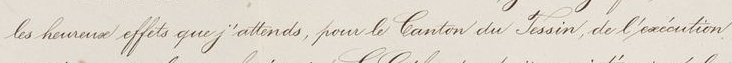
les heureux effets que j'attends, pour le Canton du Tessin, de l'exécution
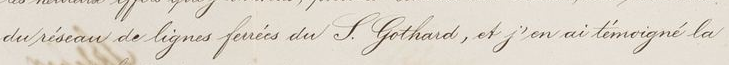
du réseau de lignes ferrées du S. Gothard, et j'en ai témoigné la
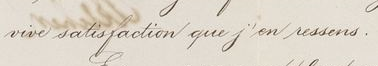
vive satisfaction que j'en ressens.
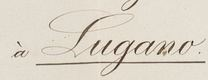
Lugano
